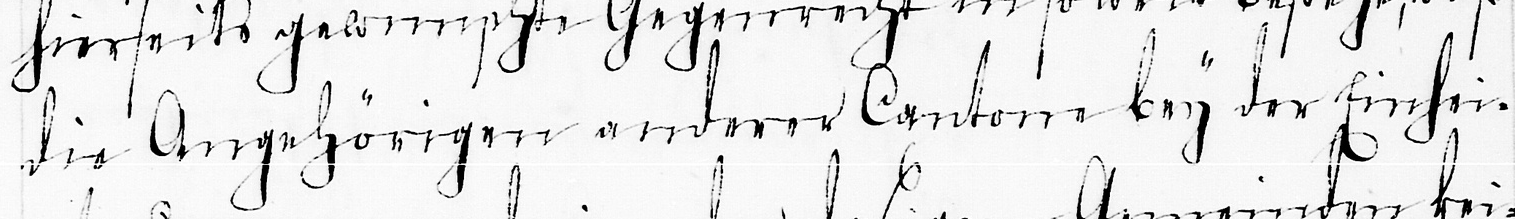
die Angehörigen anderer Cantone bey der Einhei¬
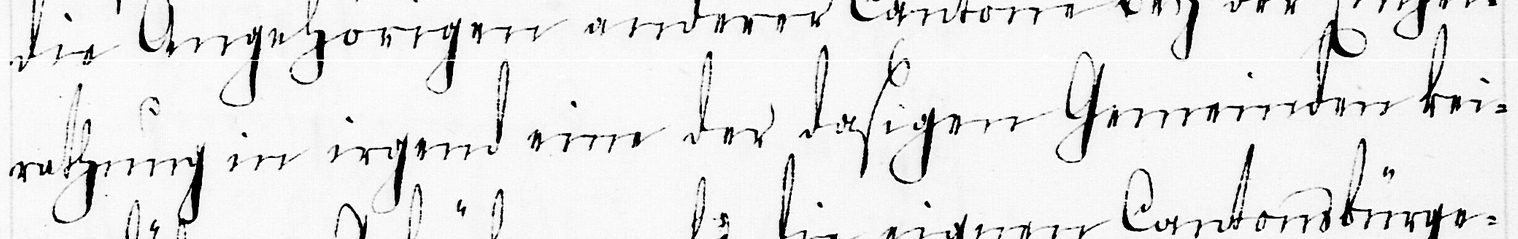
rathung in irgend eine der dasigen Gemeinden kei¬
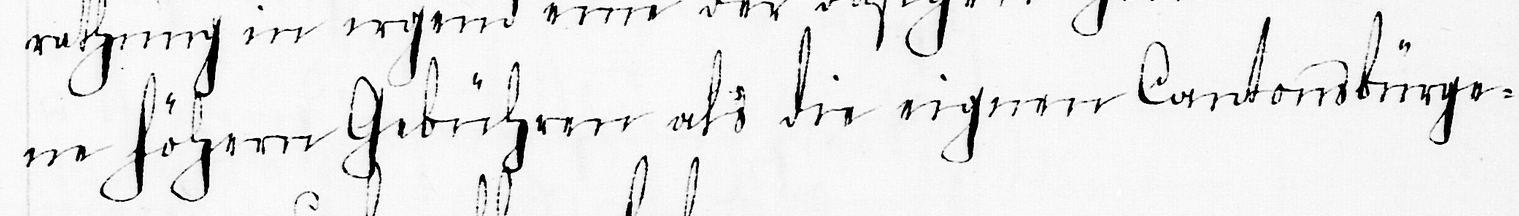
ne höhern Gebühren als die eignen Cantonsbürge¬
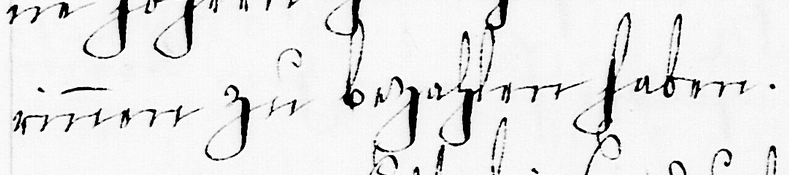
rinnen zu bezahlen haben.
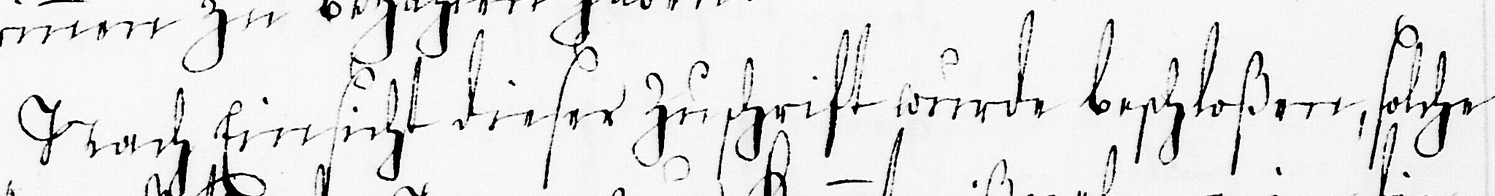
Nach Einsicht dieser Zuschrift wurde beschloßen, solche
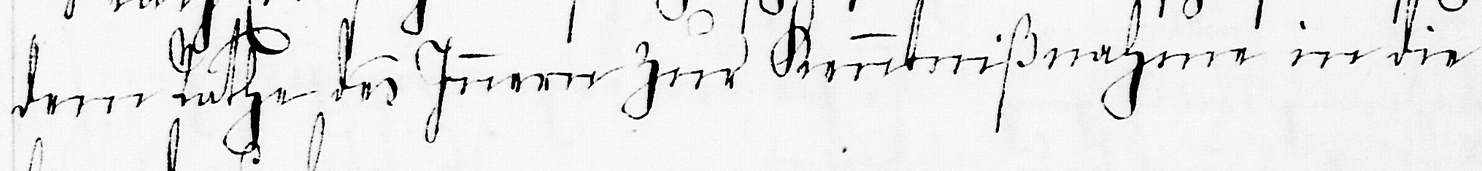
dem Rathe des Innern zur Kenntnißnahme in die
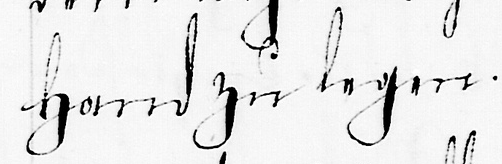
Hand zu legen.
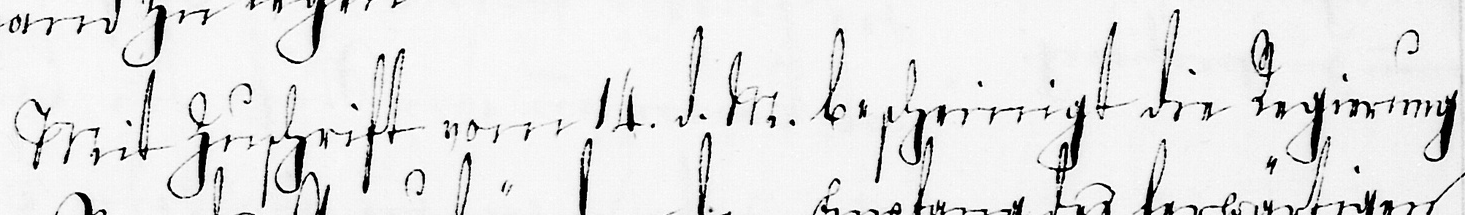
Mit Zuschrift vom 14. d. M. bescheinigt die Regierung
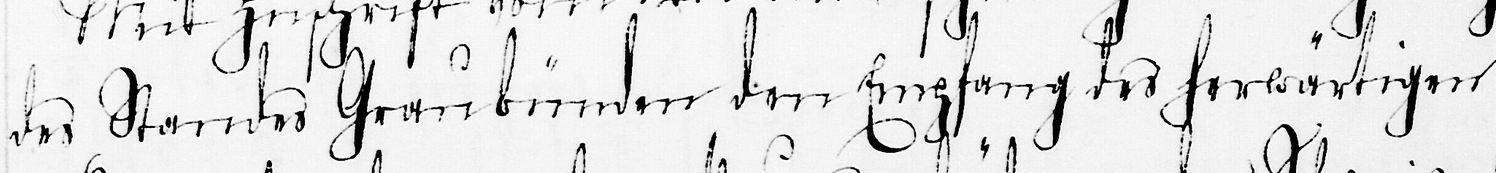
des Standes Graubünden den Empfang des herwärtigen
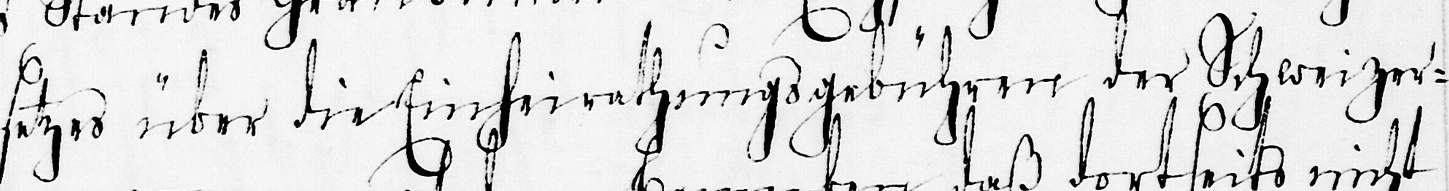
etzes über die Einheirathungsgebühren der Schweizer¬
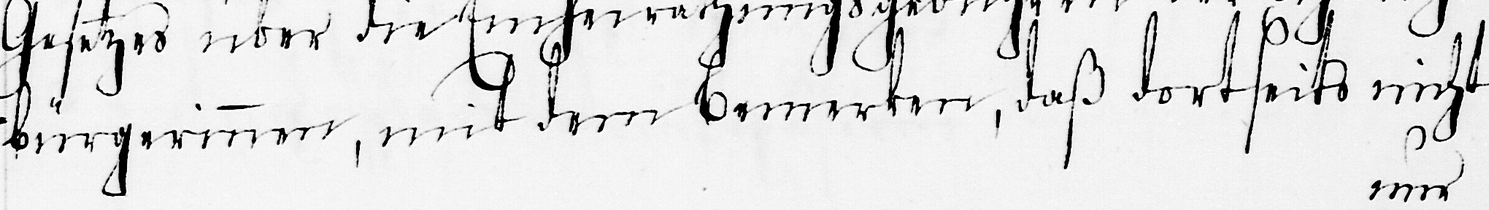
bürgerinnen, mit dem Bemerken, daß dortseits nicht
